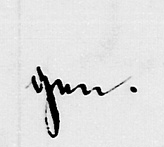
gen.
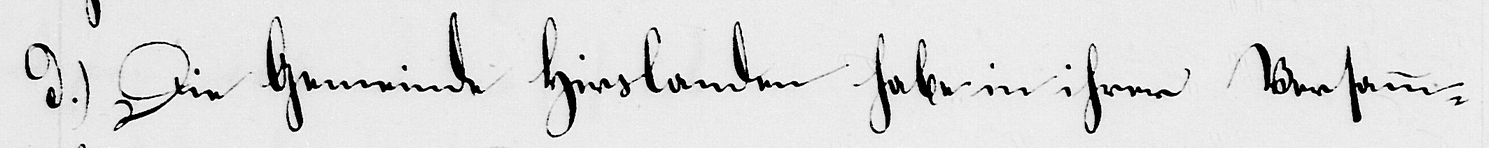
d.) Die Gemeinde Hirslanden habe in ihrer Versamm¬
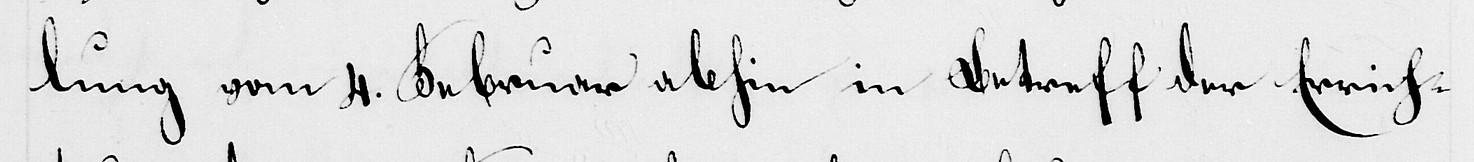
lung vom 4. Februar abhin in Betreff der Errich¬
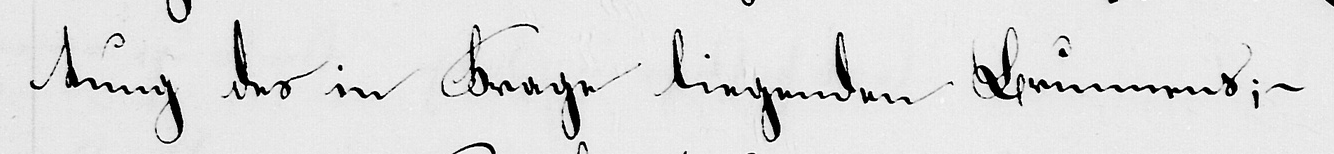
tung des in Frage liegenden Brunnens; –
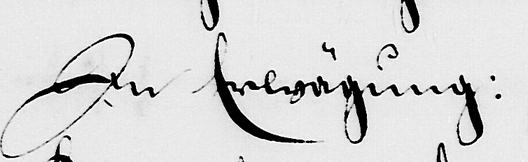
In Erwägung:
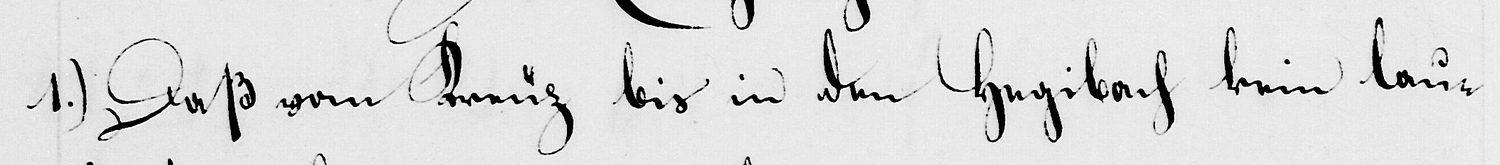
1.) Daß von Kreuz bis in den Hegibach kein lau¬
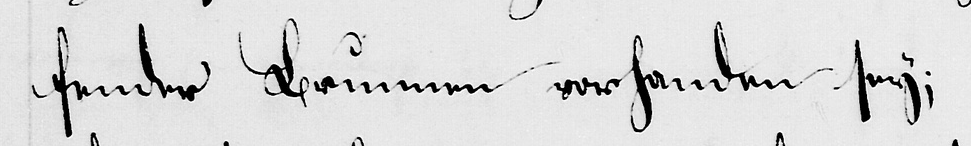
fender Brunnen vorhanden sey;
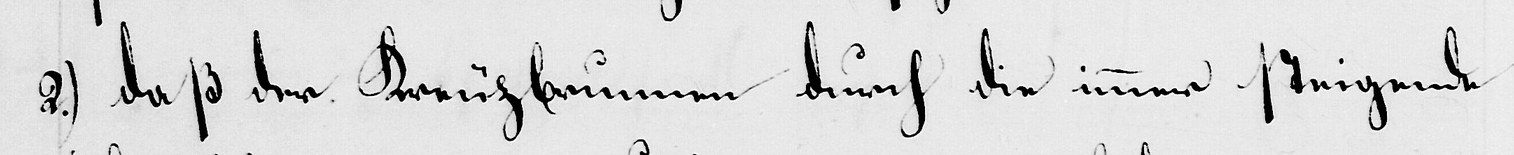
2.) daß der Kreuzbrunnen durch die immer steigende
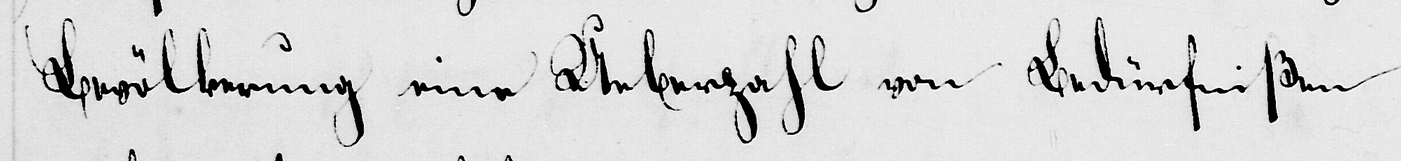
Bevölkerung eine Ueberzahl von Bedürfnißen
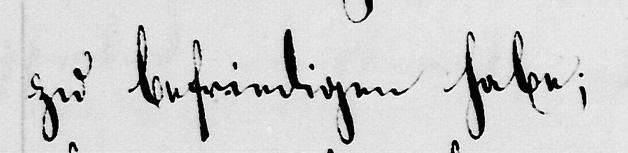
zu befriedigen habe;
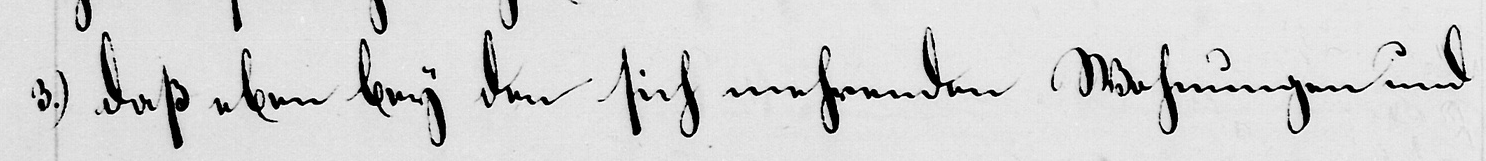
3.) daß aber bey den sich mehrenden Mahnungen und
